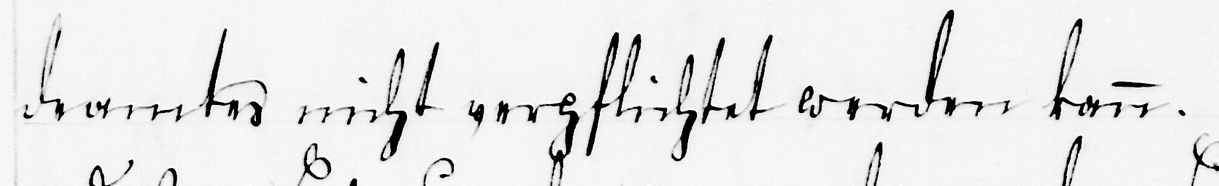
deamtes nicht verpflichtet werden kann.
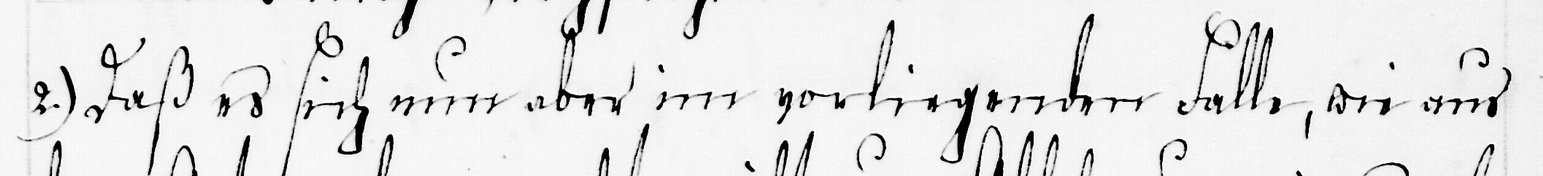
2.) Daß es sich nun aber im vorliegenden Falle, wie aus
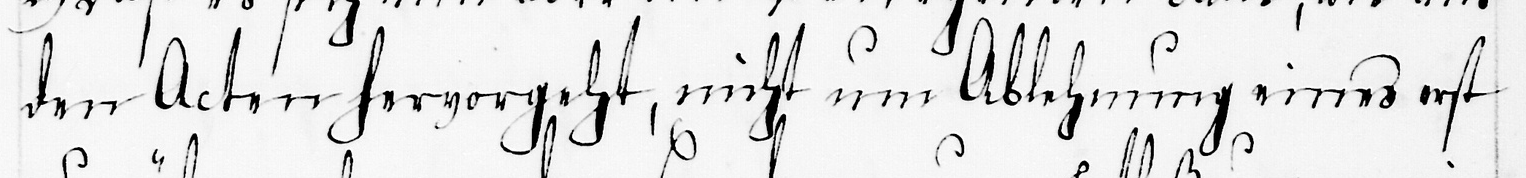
den Acten hervorgeht, nicht um Ablehnung eines erst
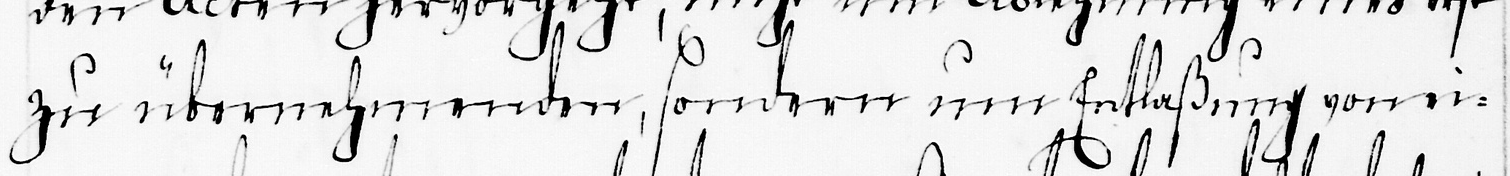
zu übernehmenden, sondern um Entlaßung von ei¬
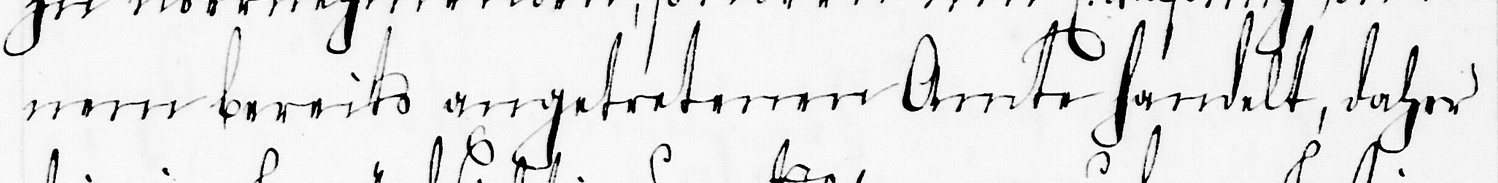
nem bereits angetretenen Amte handelt, daher
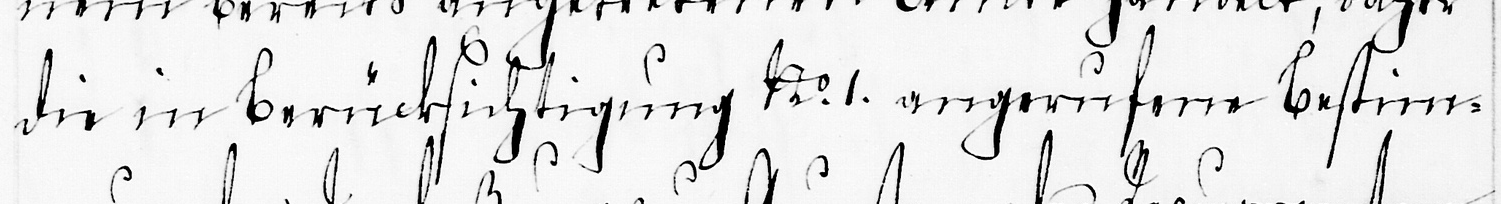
die in Berücksichtigung N°. 1. angerufene Bestimm¬
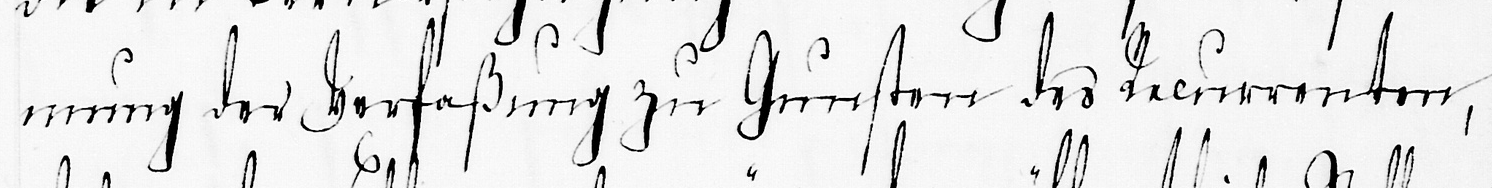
ung der Verfaßung zu Gunsten des Recurrenten,
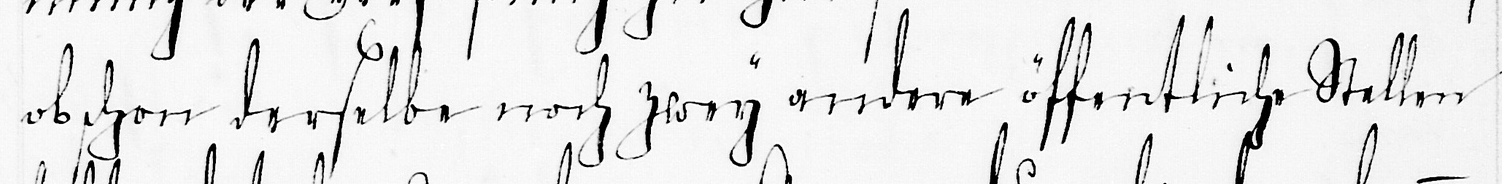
obschon derselbe noch zwey andere öffentliche Stellen
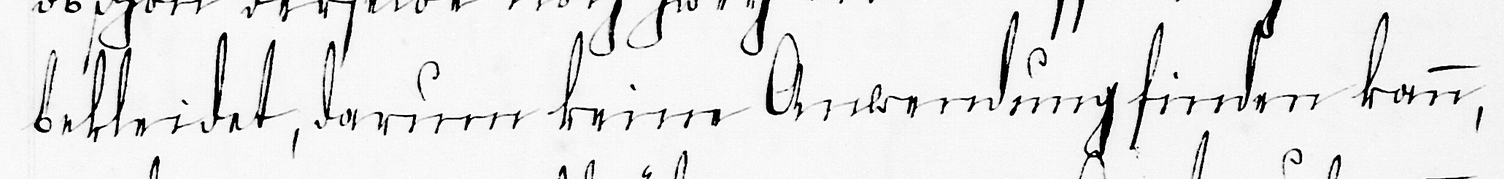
bekleidet, darum keine Anwendung finden kann,
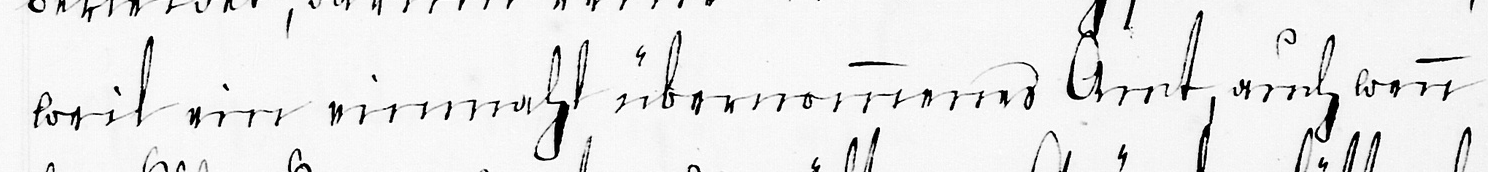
weil ein einmahl übernommenes Amt, auch wenn
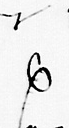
2.
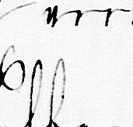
1.
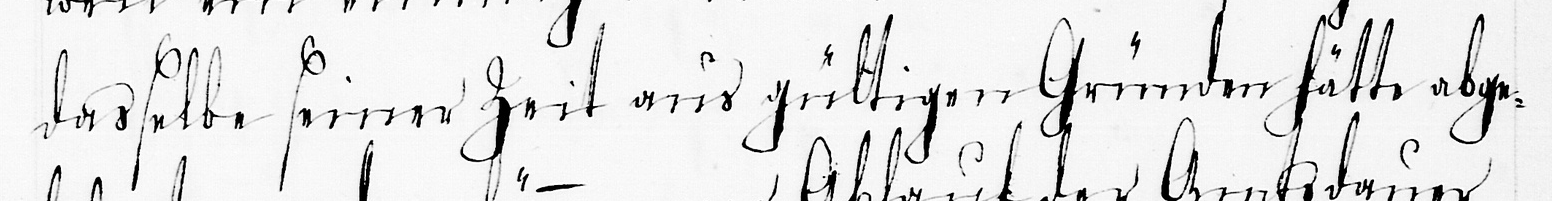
dasselbe seiner Zeit aus gültigen Gründen hätte abge¬
